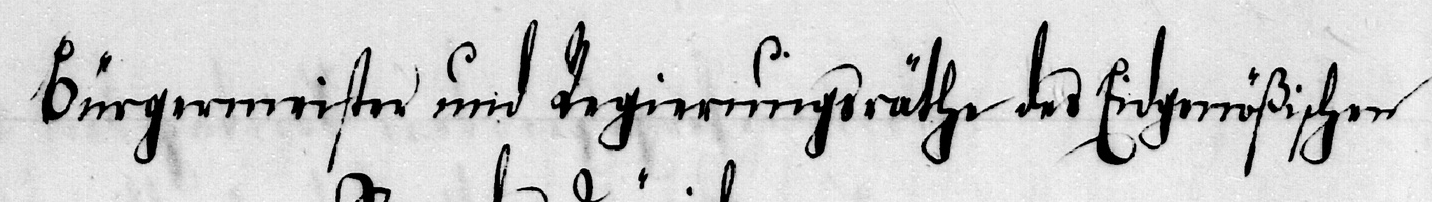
Bürgermeister und Regierungsräthe des Eidgenößischen¬
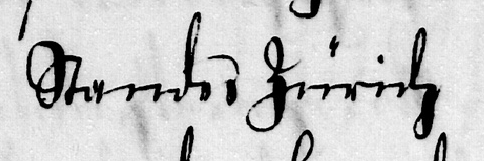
Standes Zürich
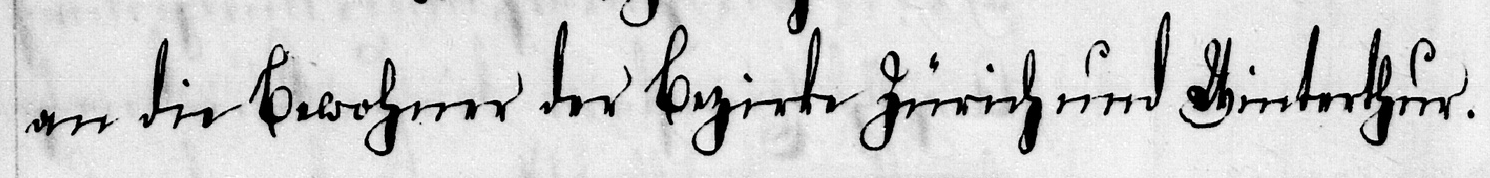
an die Bewohner der Bezirke Zürich und Winterthur.
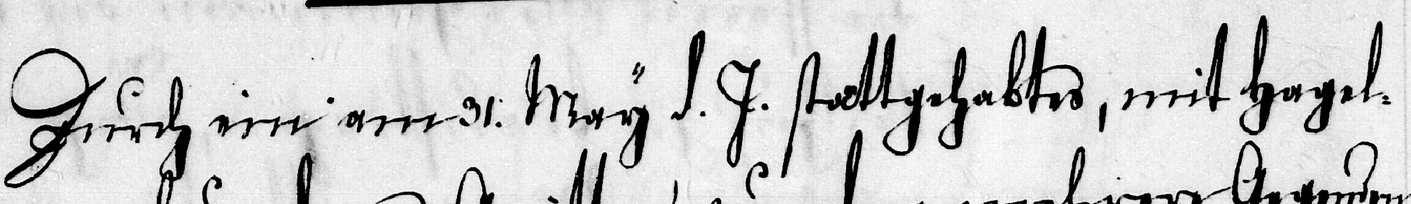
Durch ein am 31. May d. J. stattgehabtes, mit Hagel¬
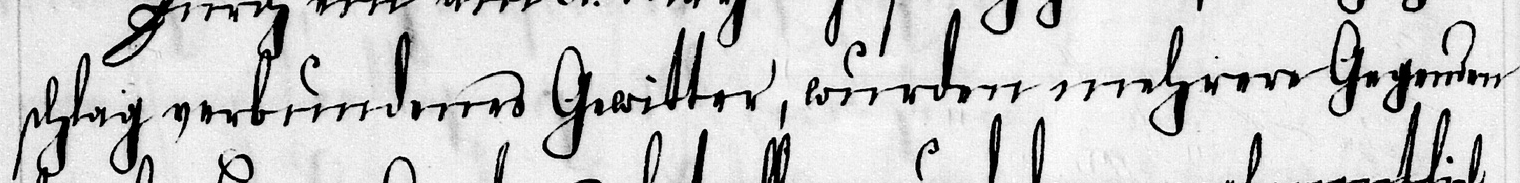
schlag verbundenes Gewitter, wurden mehrere Gegenden
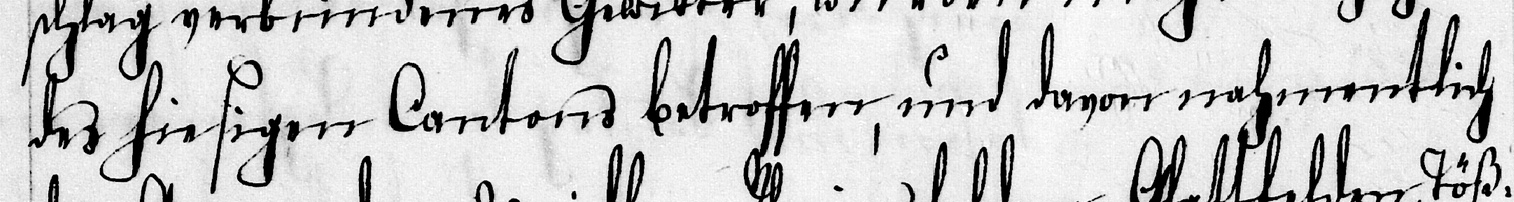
des hiesigen Cantons betroffen, und davon nahmentlich
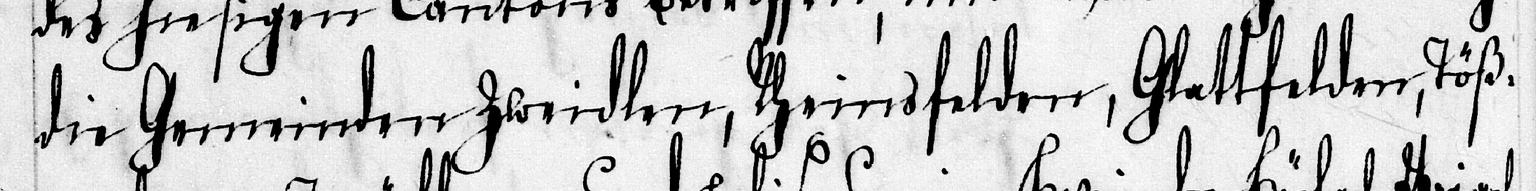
die Gemeinden Zweidlen, Rheinsfelden, Glattfelden, Töß¬
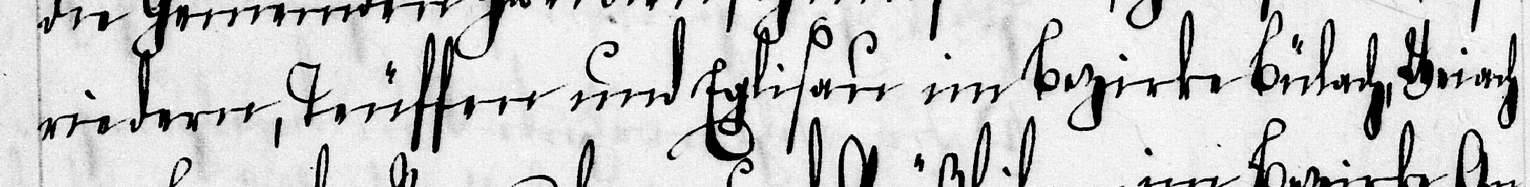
riedern, Teuffen und Eglisau im Bezirke Bülach, Weia¬
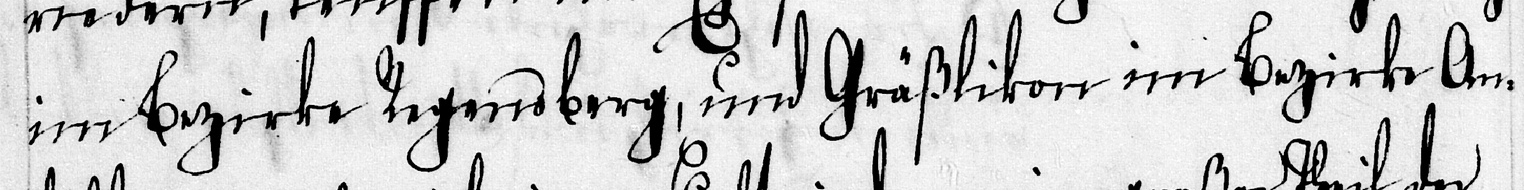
im Bezirke Regensberg, und Gräßlikon im Bezirke An¬
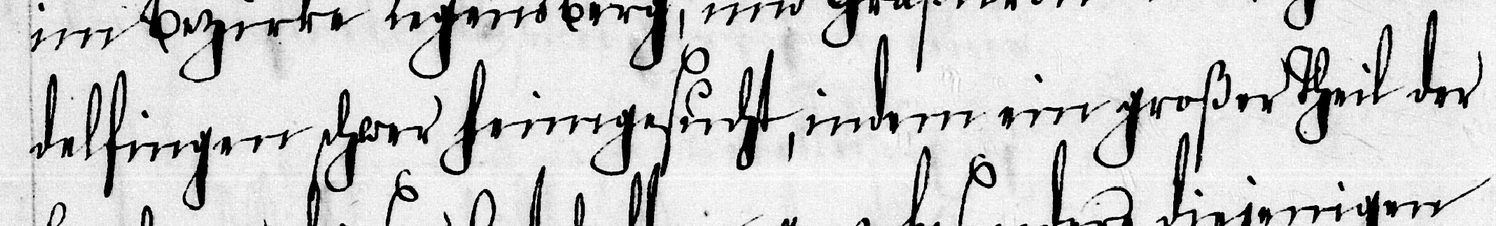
delfingen schwer heimgesucht, indem ein großer Theil der
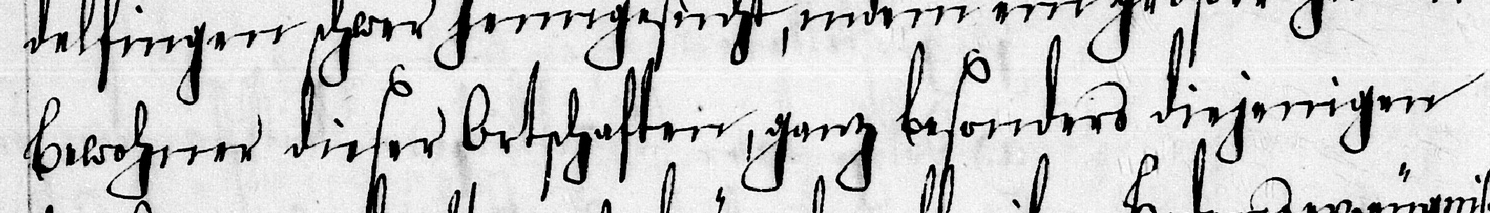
Bewohner dieser Ortschaften, ganz besonders diejenigen
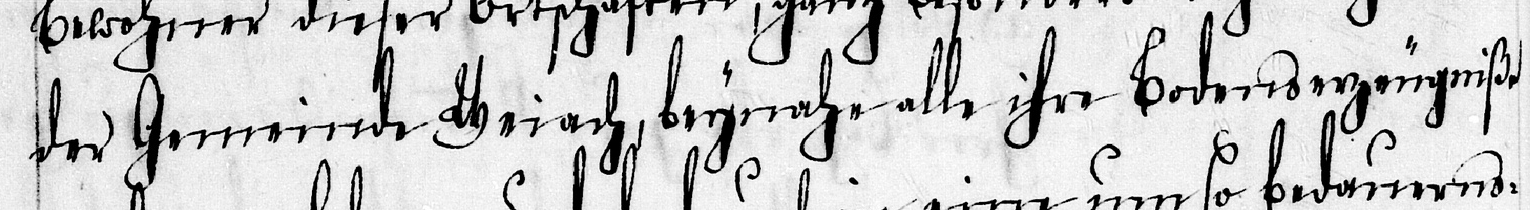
der Gemeinde Weiach, beynahe alle ihre Bodenserzeugniße
